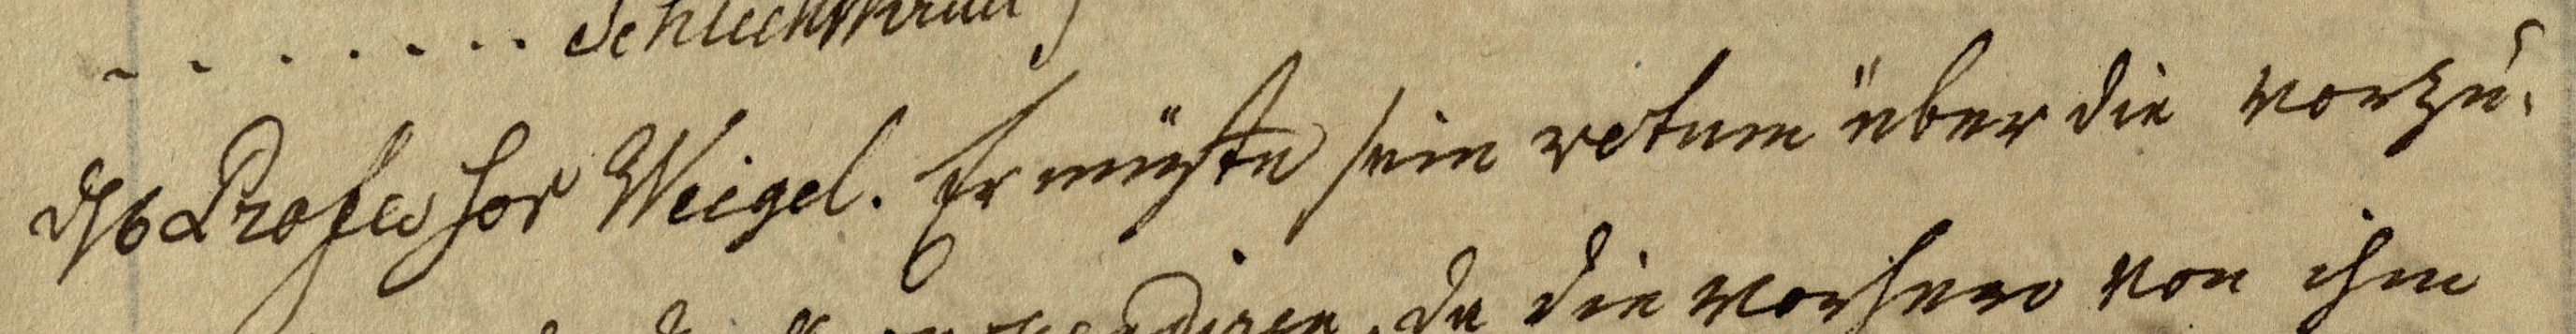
dh Professor Weigel. Er müßte sein votum über die vorzu¬
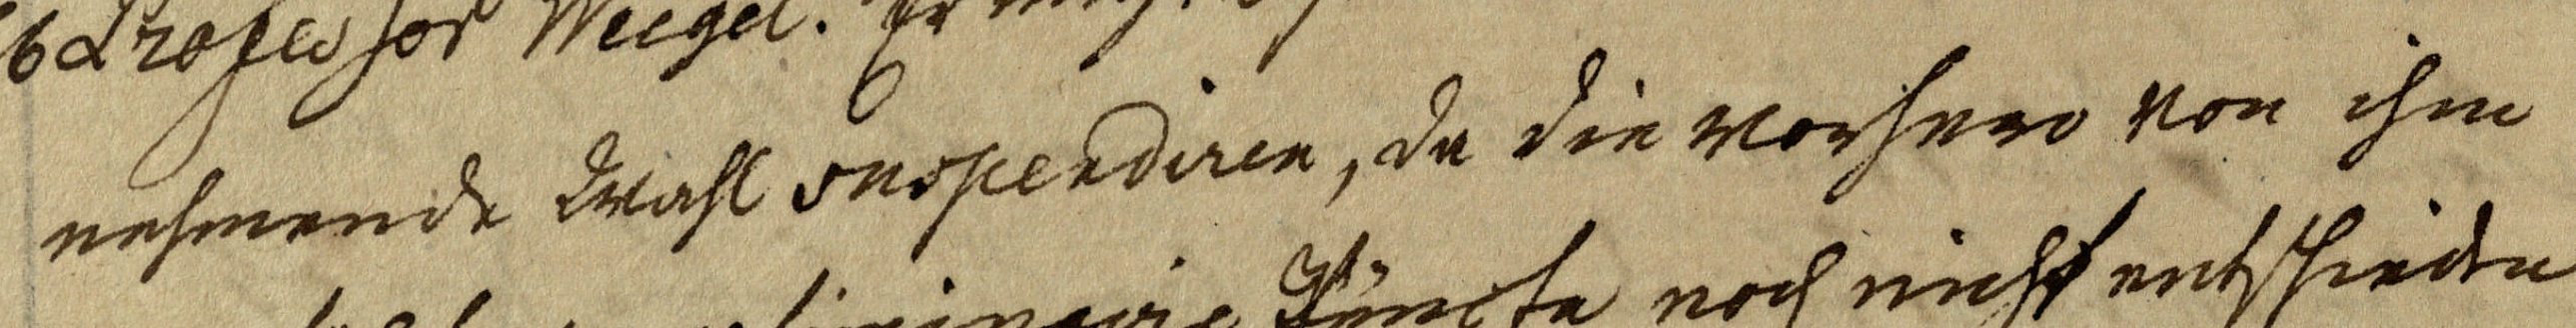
nehmende Wahl suspendiren, da die vorhero von ihm
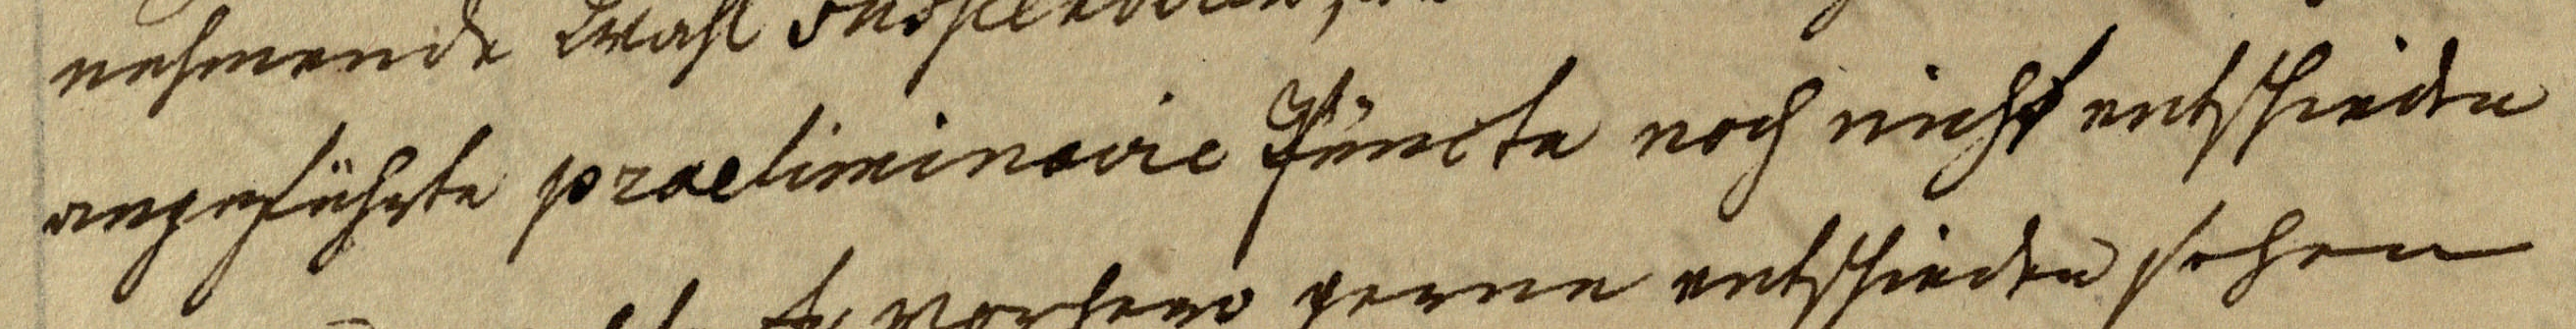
angeführte praeliminaire Puncte noch nicht entschieden
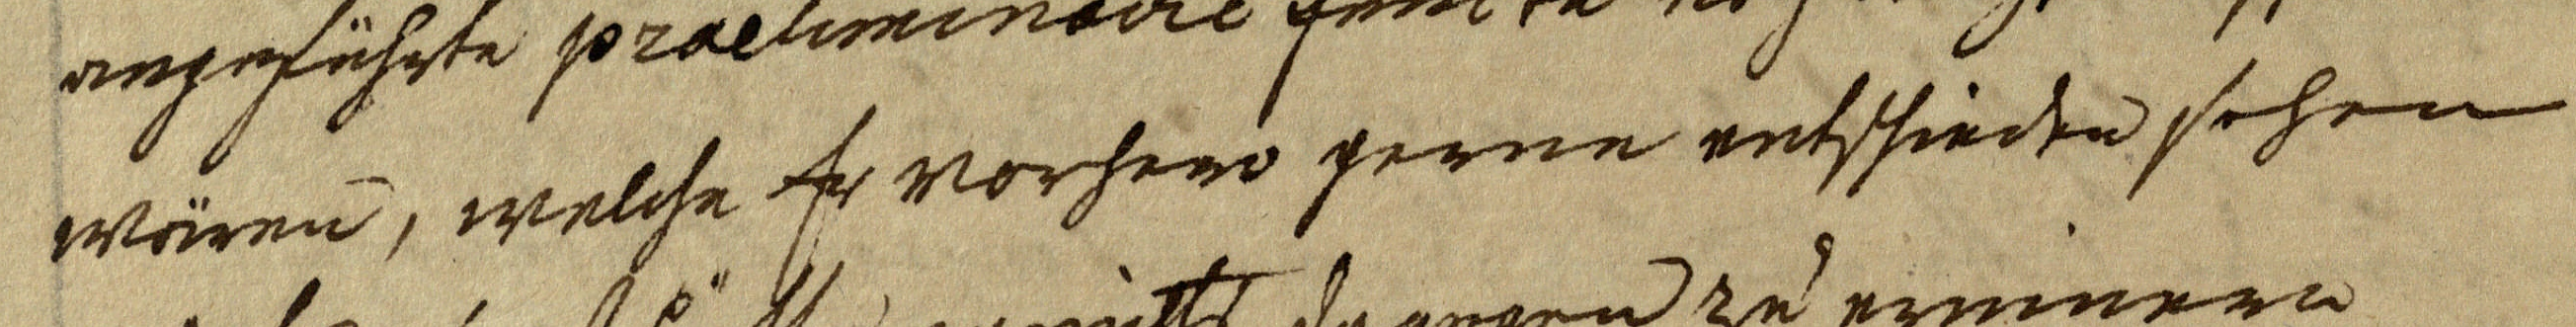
wären, welche Er vorhero gerne entschieden sehen
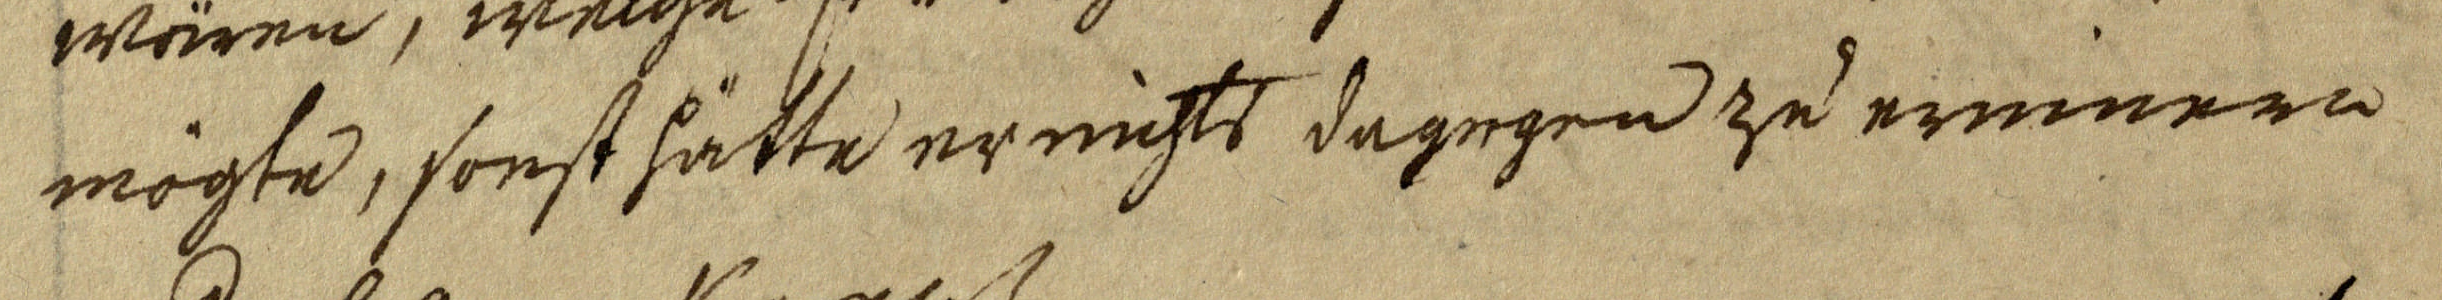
mögte, sonst hätte er nicht dagegen zu erinnern
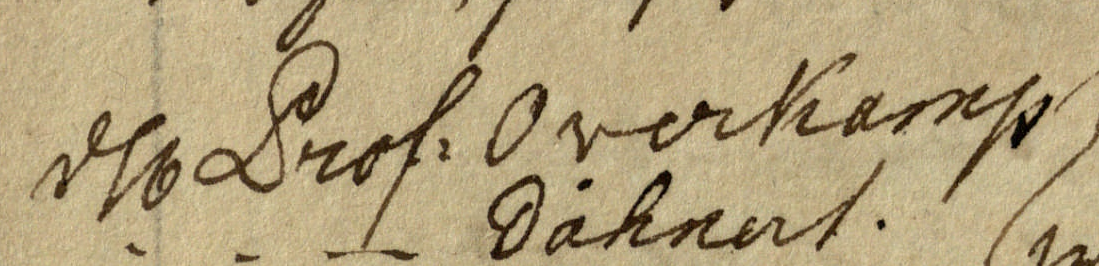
dh. Prof. Overkamp
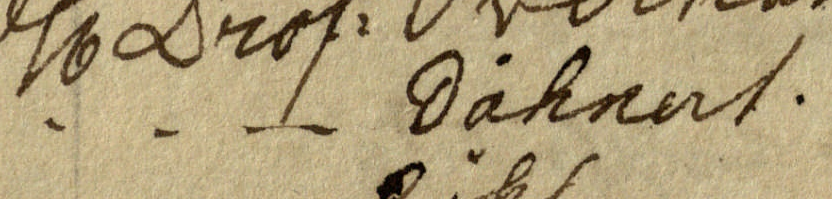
Dähnert.
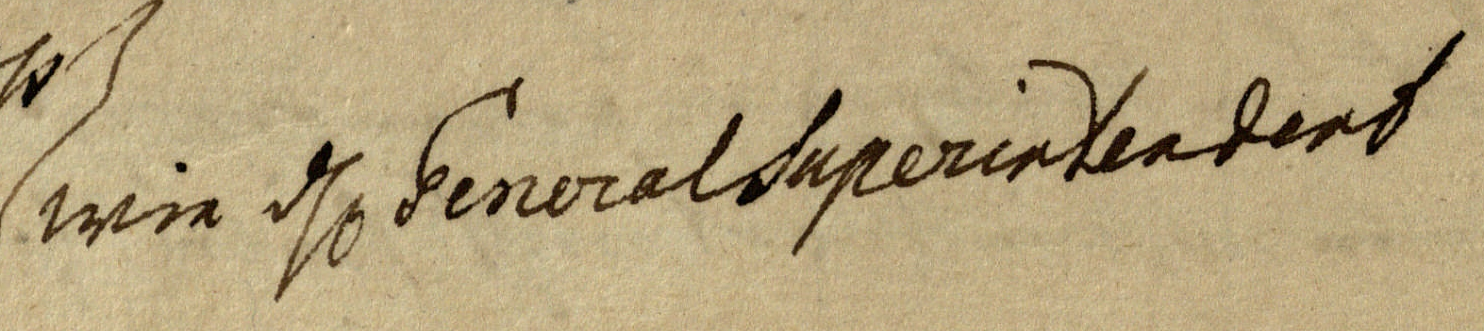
wie dh, GeneralSuperintendent
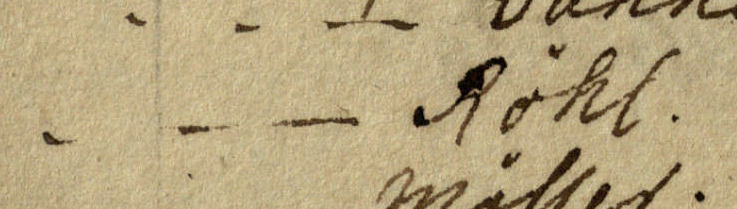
Röhl.
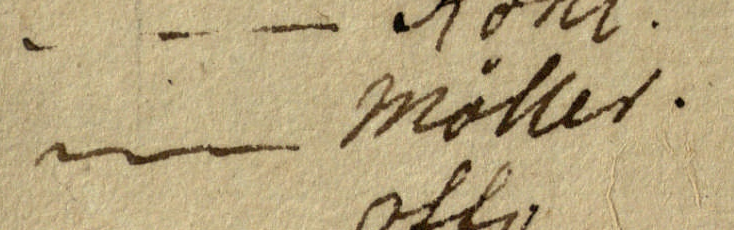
Möller.
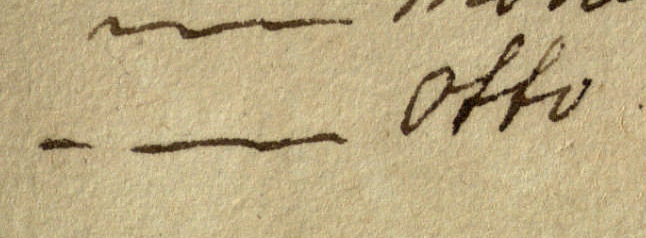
Otto
